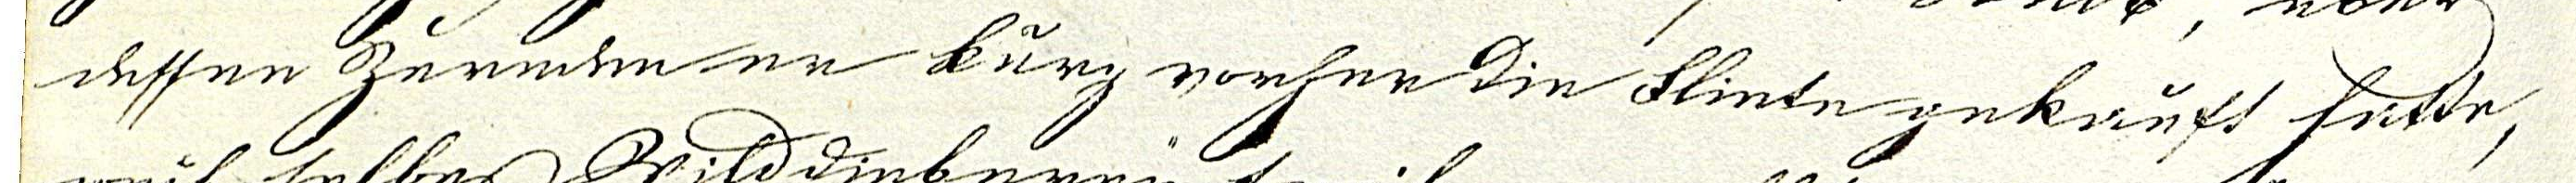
dessen Zureden er kurz vorher die Flinte gekauft hatte,
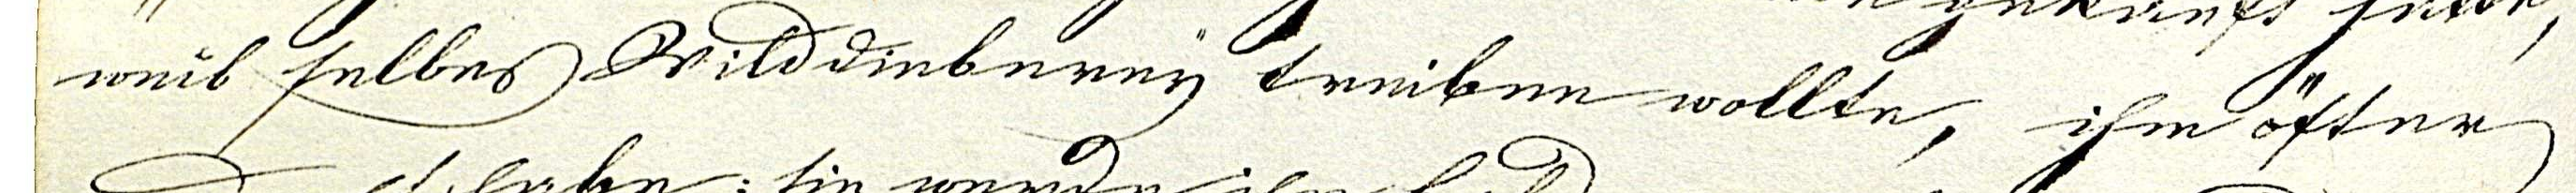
weib selbes Wilddieberey treiben wollte, ihm öfter
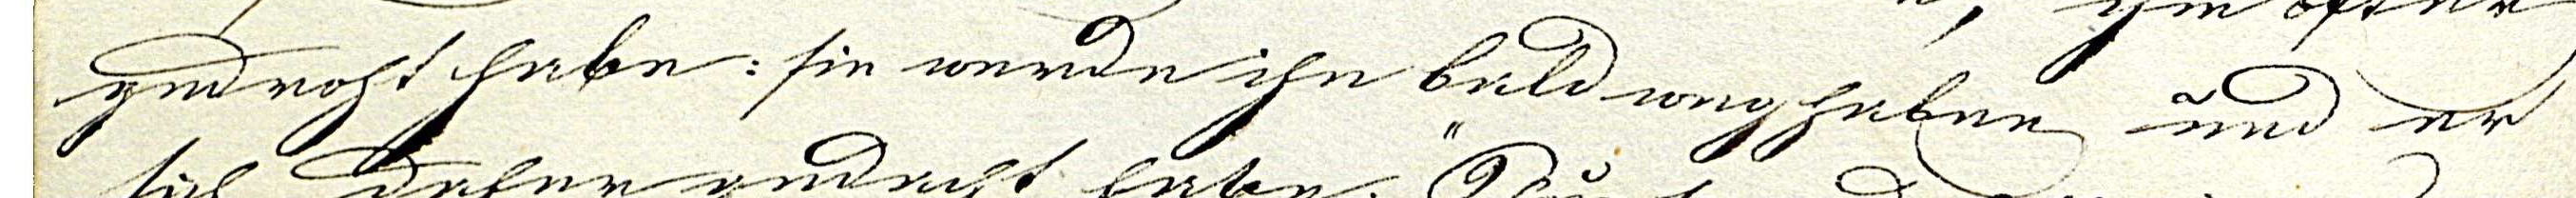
gedroht habe: sie werde ihn bald weghaben und er
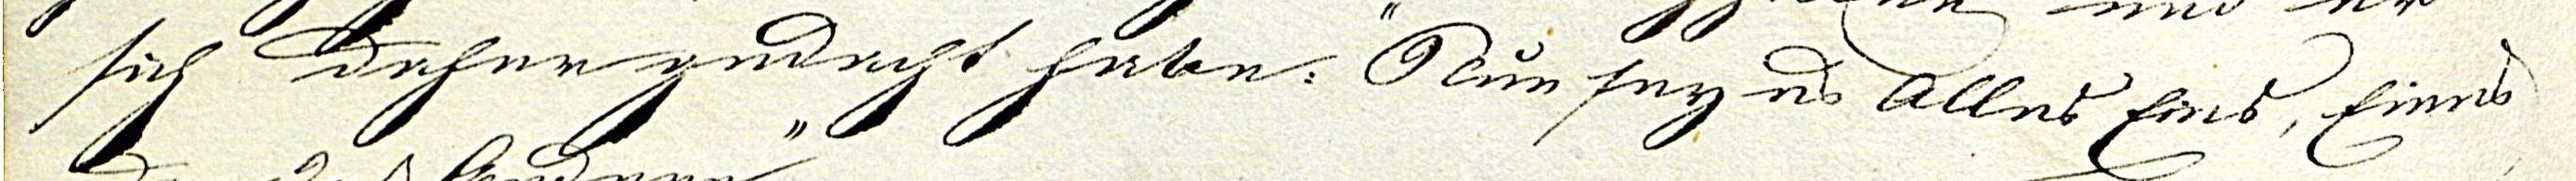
sich daher gedacht habe: "Nun sey es Alles Eins, Eines
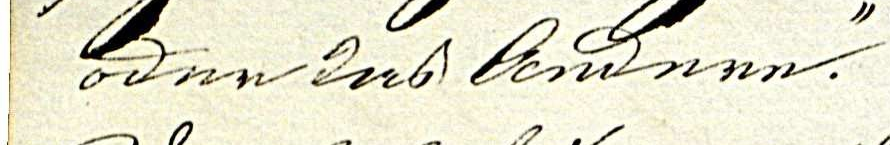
oder das Andere."
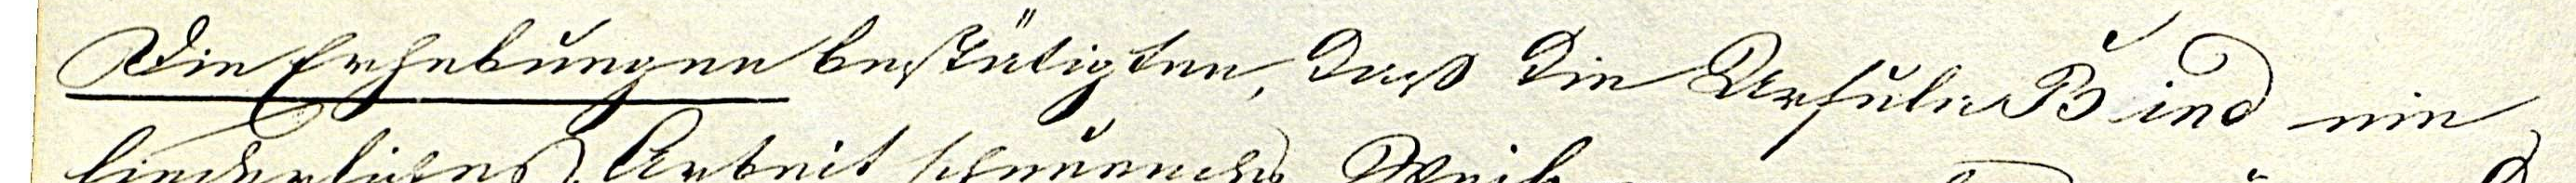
Die Erhebungen bestätigten, daß die Ursula Bind ein
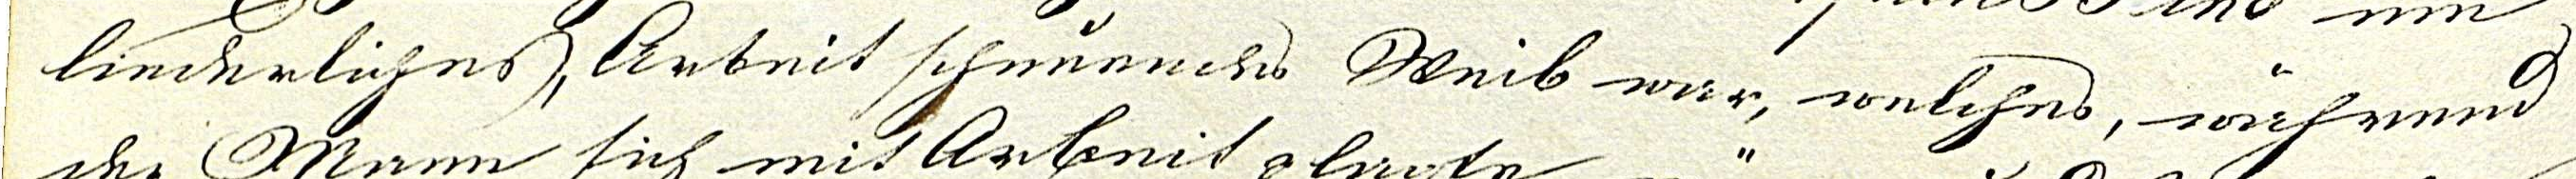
liederliches, Arbeit scheuendes Weib war, welches, während
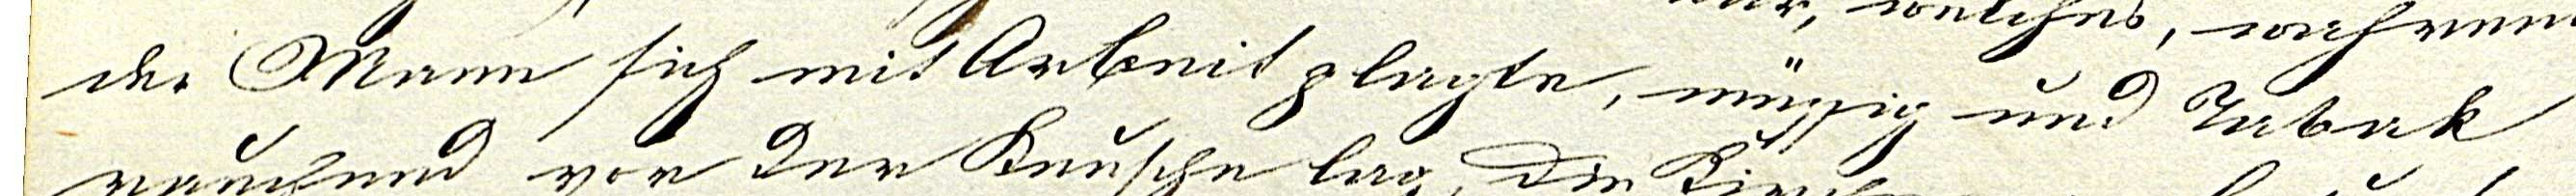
der Mann sich mit Arbeit plagte, müssig und Tabak
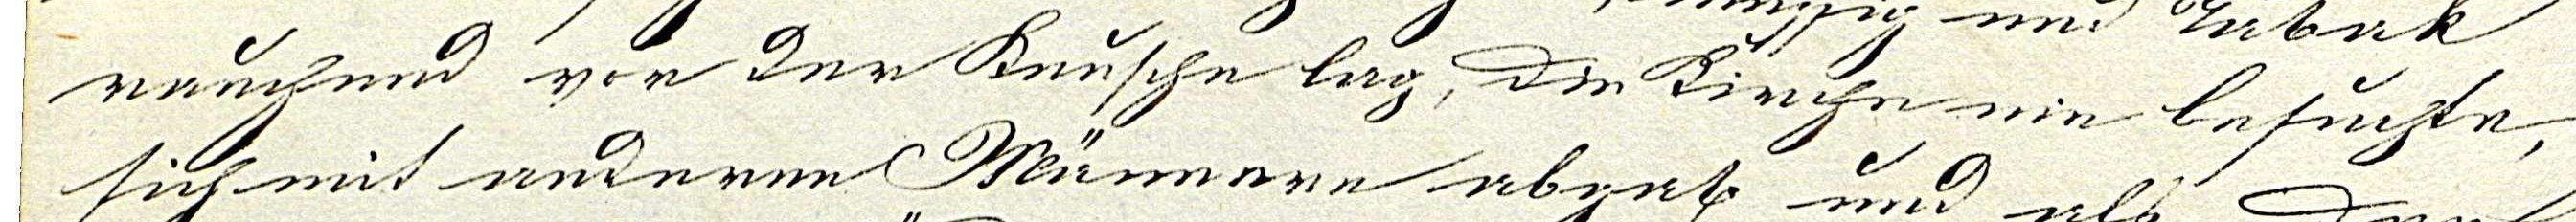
rauchend vor der Keusche lag, die Kirchwein besuchte,
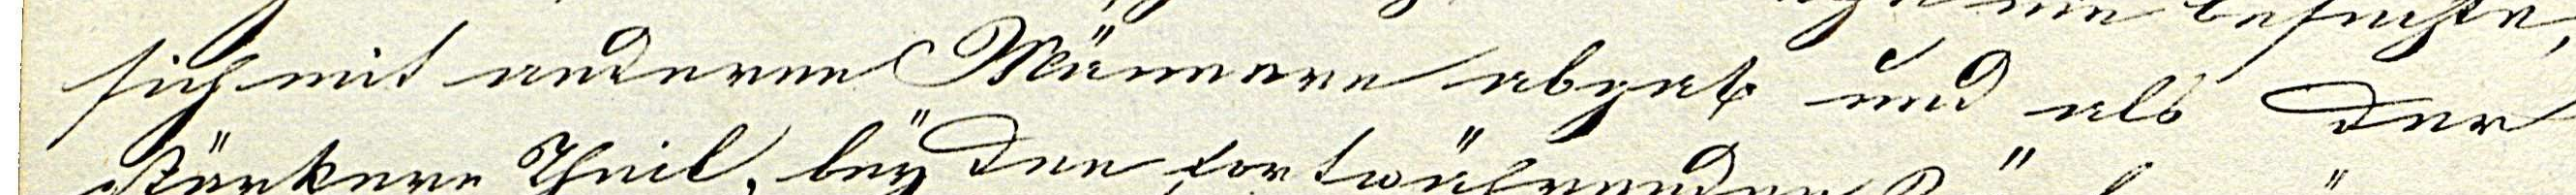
sich mit anderen Männern abgab und als der
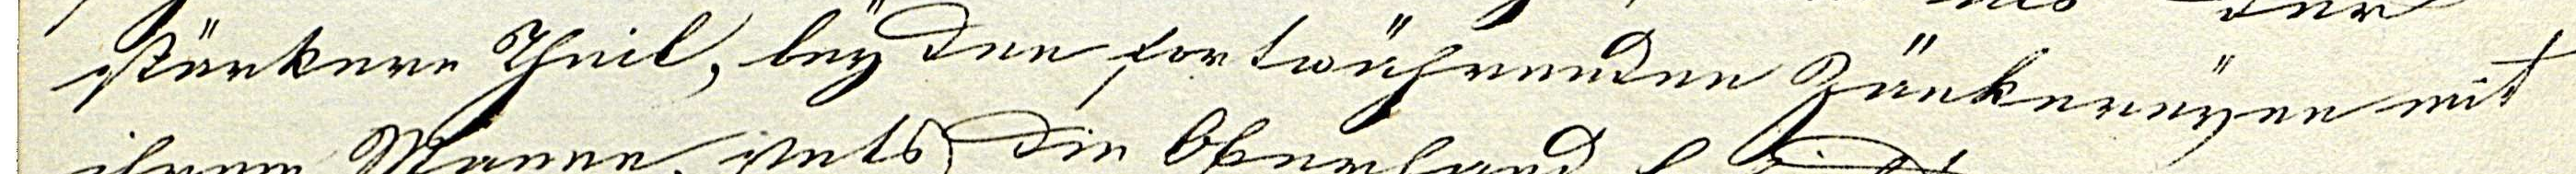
stärkere Theil, bey den fortwährenden Zänkerüven mit
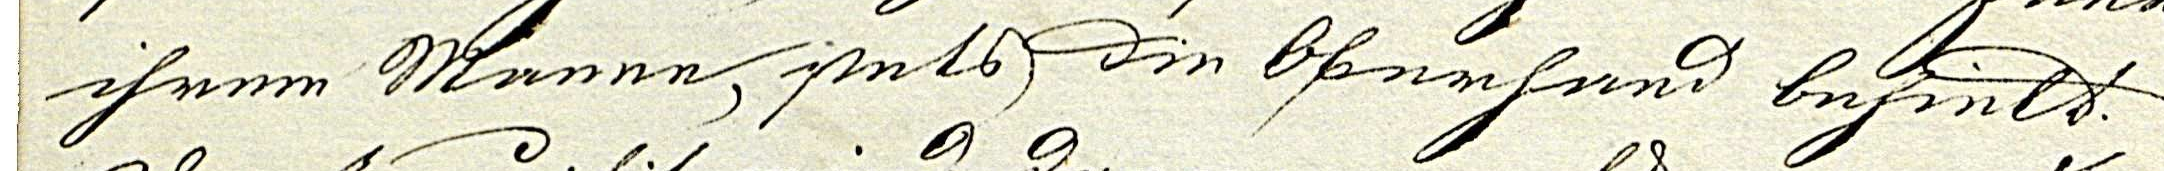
ihrem Männe, stets die Oberhand behielt.
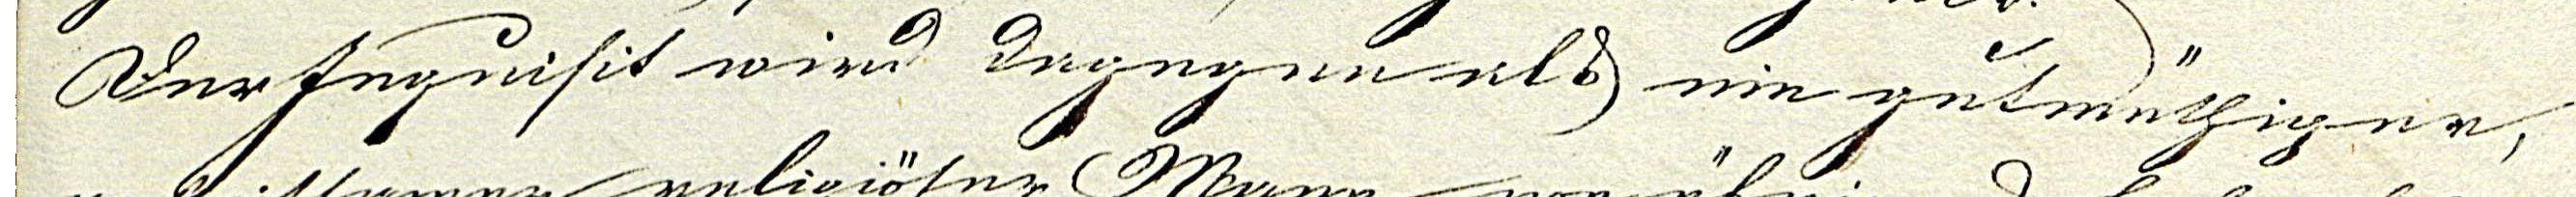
Der Jnquisit wird dagegen als nie gutmüthigen,
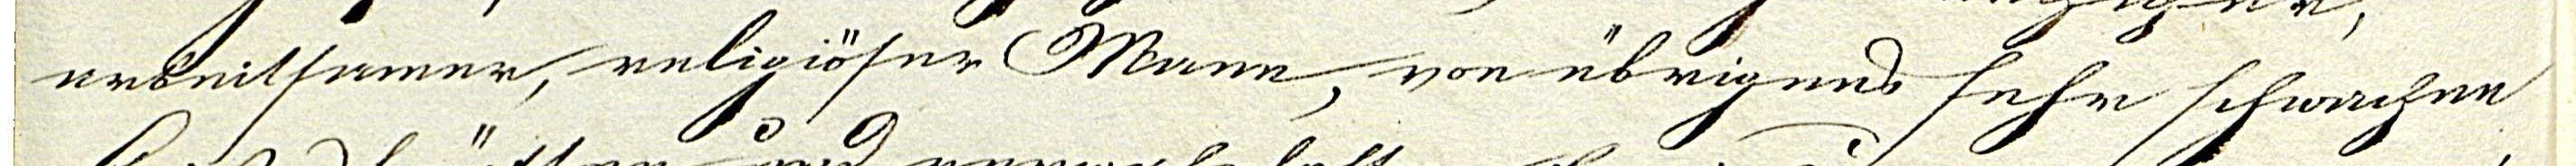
arbeitsamer, religiöser Mann, von übrigens sehr schwachen
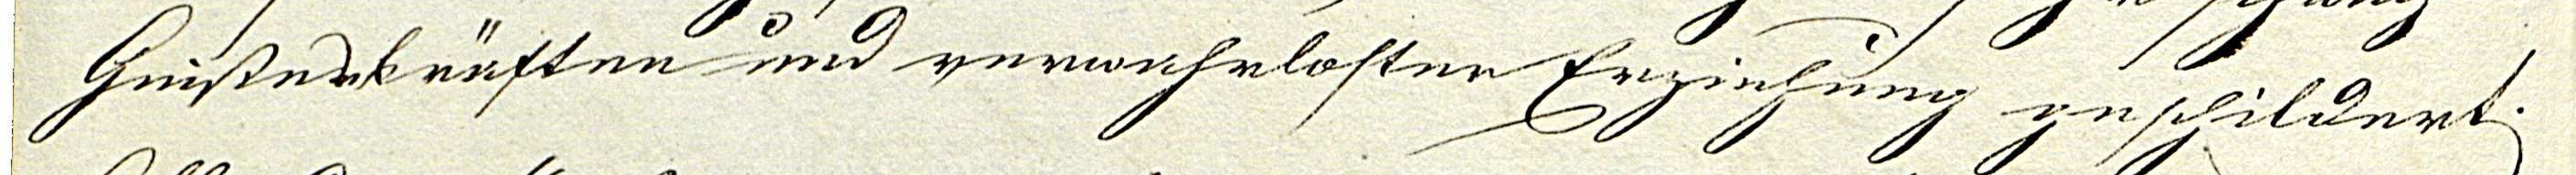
Geisterkräften und verwahrloster Erziehung geschildert.
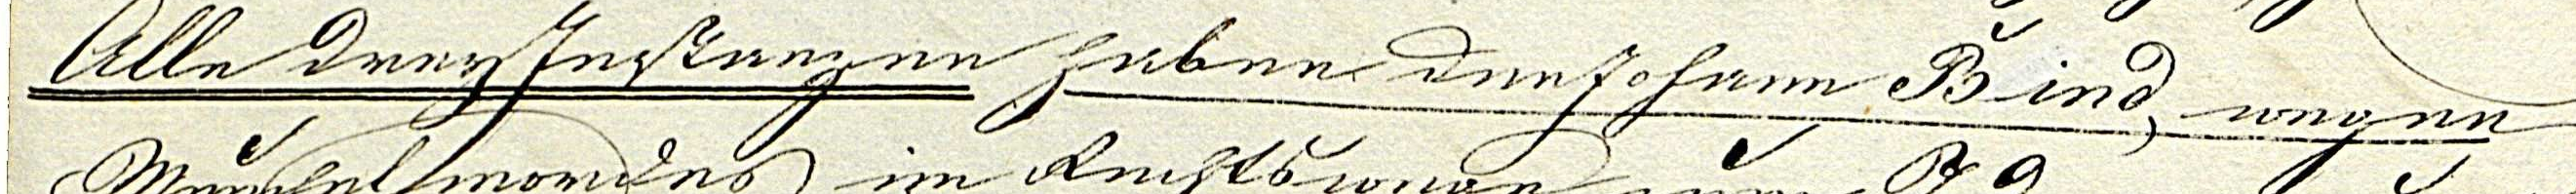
Alle drey Jnstanzen haben den Johann Bind, wegen
